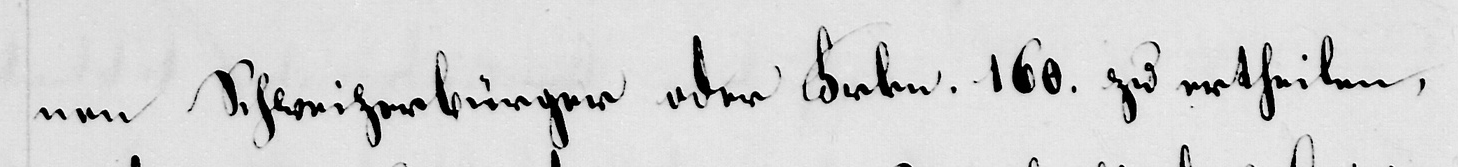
nen Schweizerbürger oder Frkn. 160. zu ertheilen,
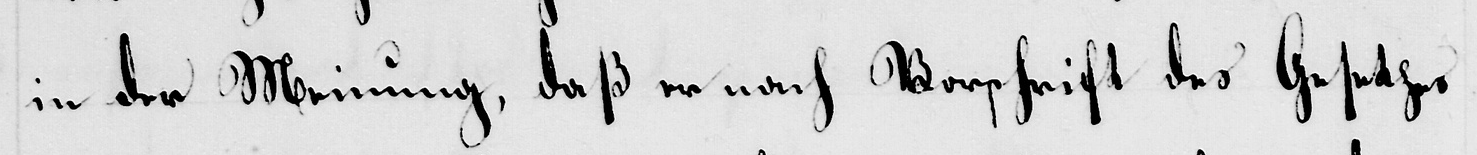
in der Meinung, daß er nach Vorschrift des Gesetzes
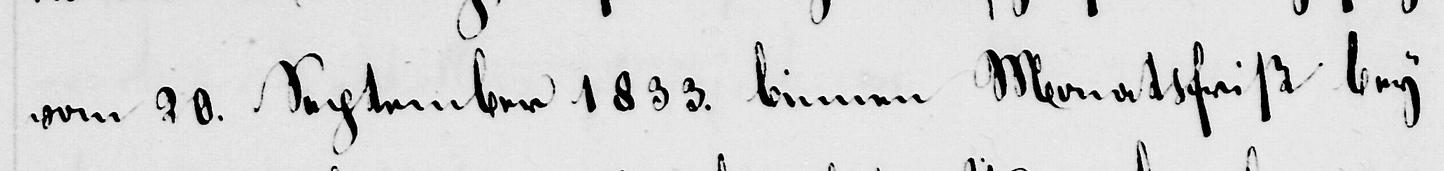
vom 20. September 1833. binnen Monatsfrist bey
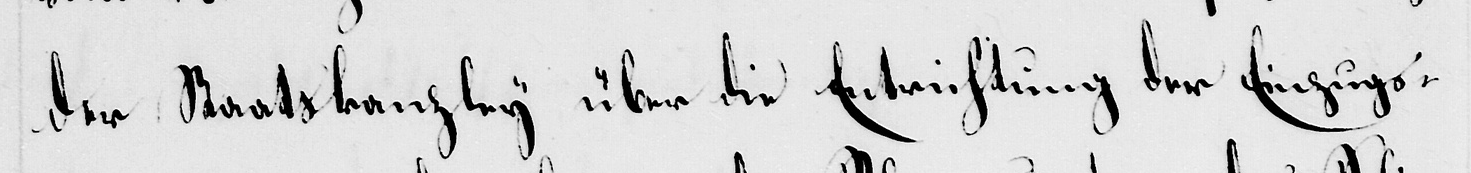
der Staatskanzley über die Entrichtung der Eingangs¬
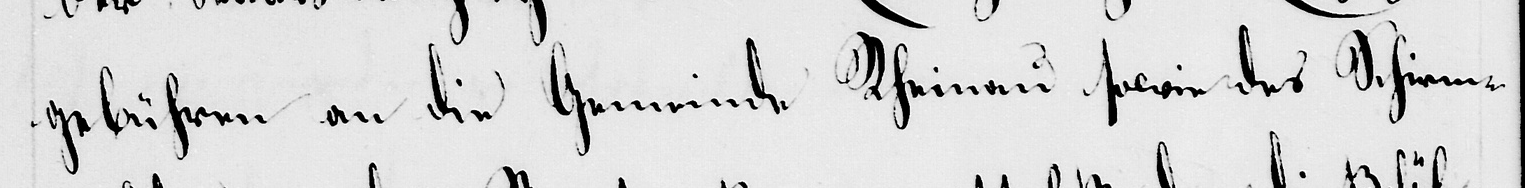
gebühren an die Gemeinde Rheinau sowie des Schirm¬
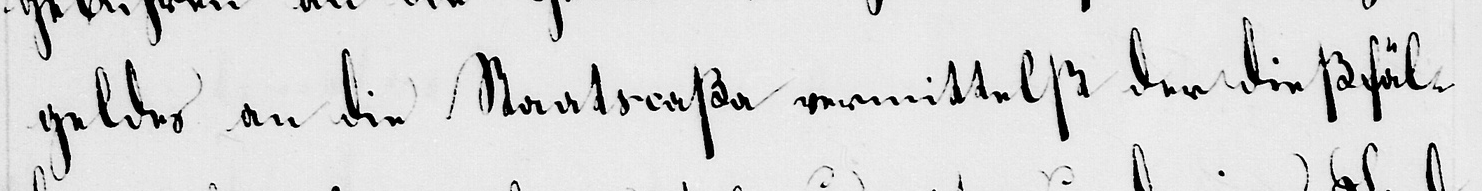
geldes an die Staatscaßa vermittelst der dießfäl¬
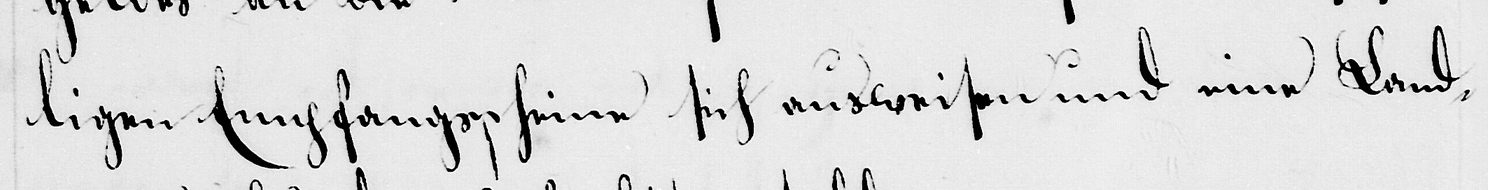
ligen Empfangsscheine sich ausweisen und eine Land¬
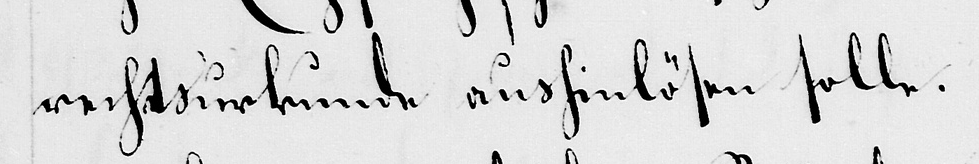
rechtsurkunde aushinlösen solle.
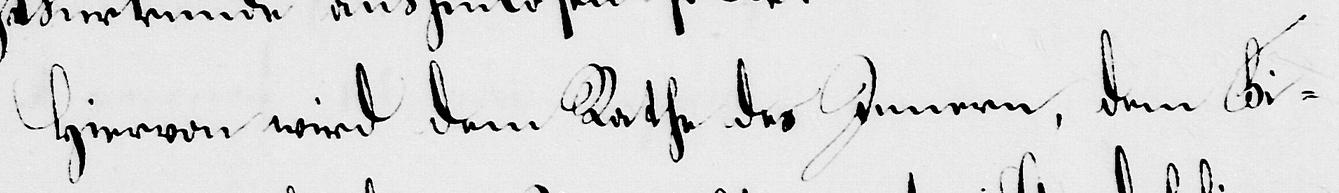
Hiervon wird dem Rathes des Innern, dem Fi¬
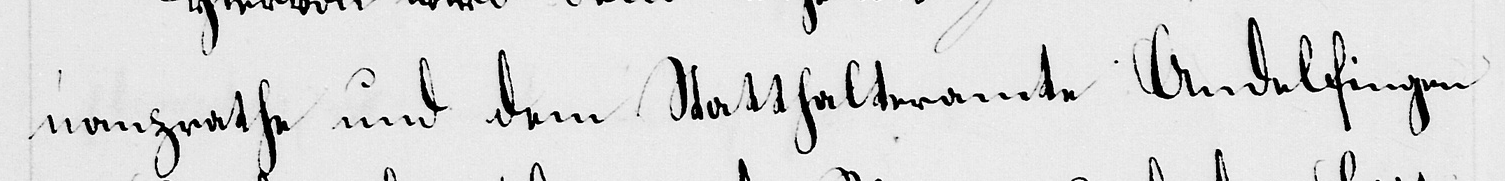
nanzrathe und dem Statthalteramte Andelfingen
